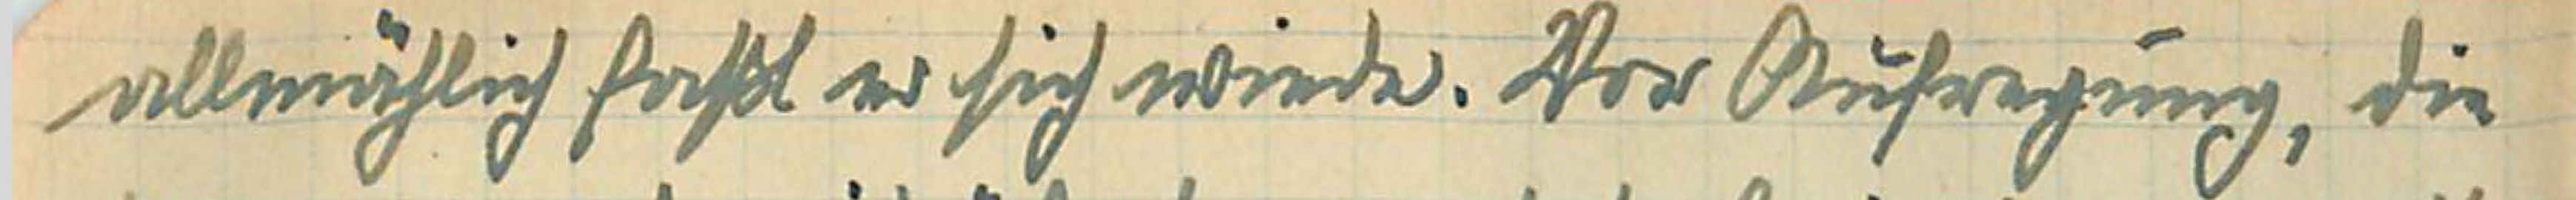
allmählich faßt er sich wieder. Vor Aufregung, die
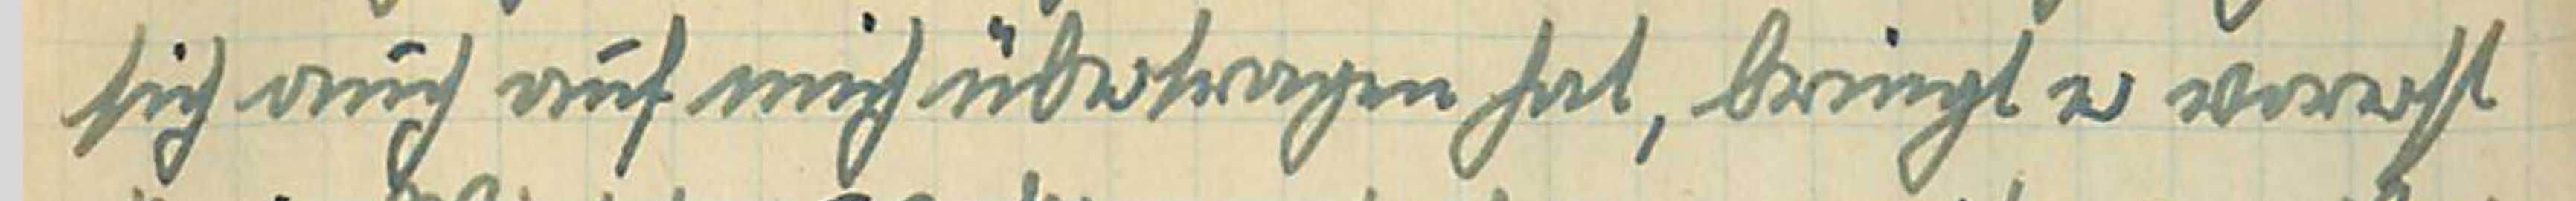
sich auch auf mich übertragen hat, bringt er vorerst
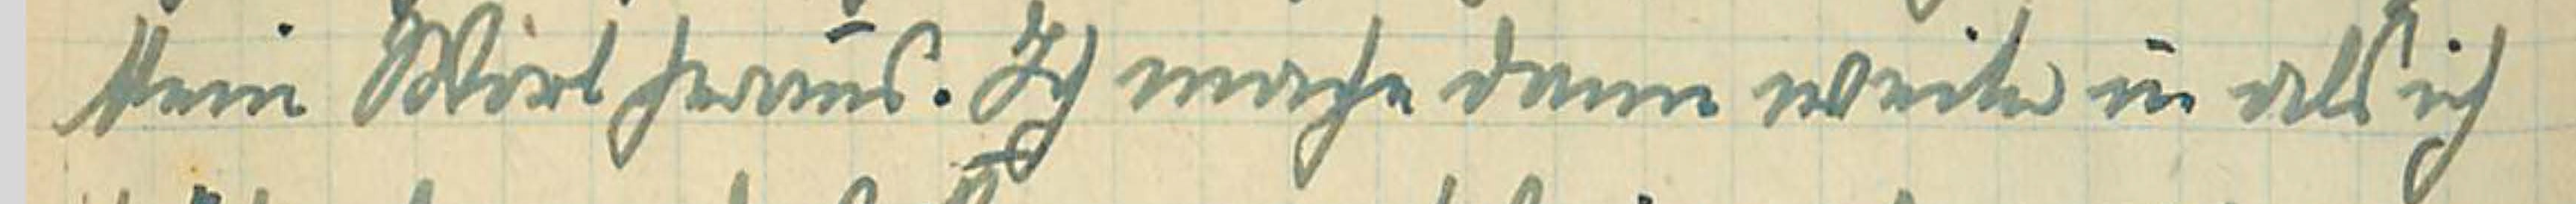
kein Wort heraus. Ich mache dann weiter u. als ich
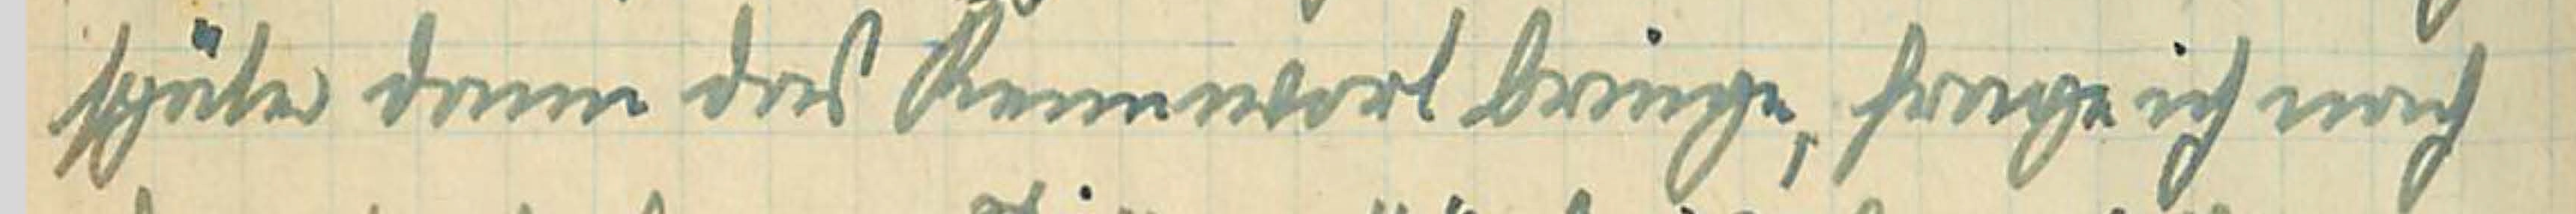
später dann das Kennwort bringe, frage ich nach
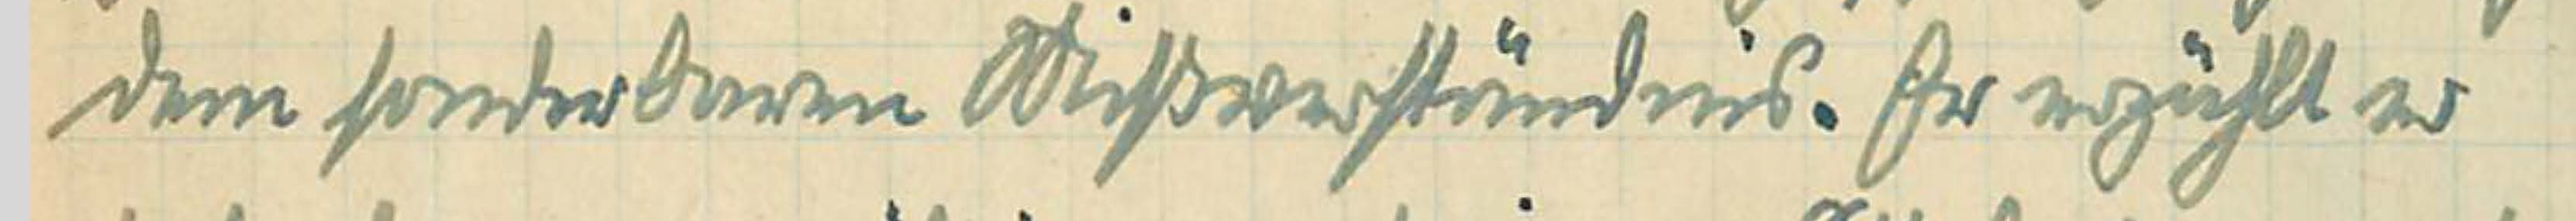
dem sonderbaren Mißverständnis. Er erzählt er
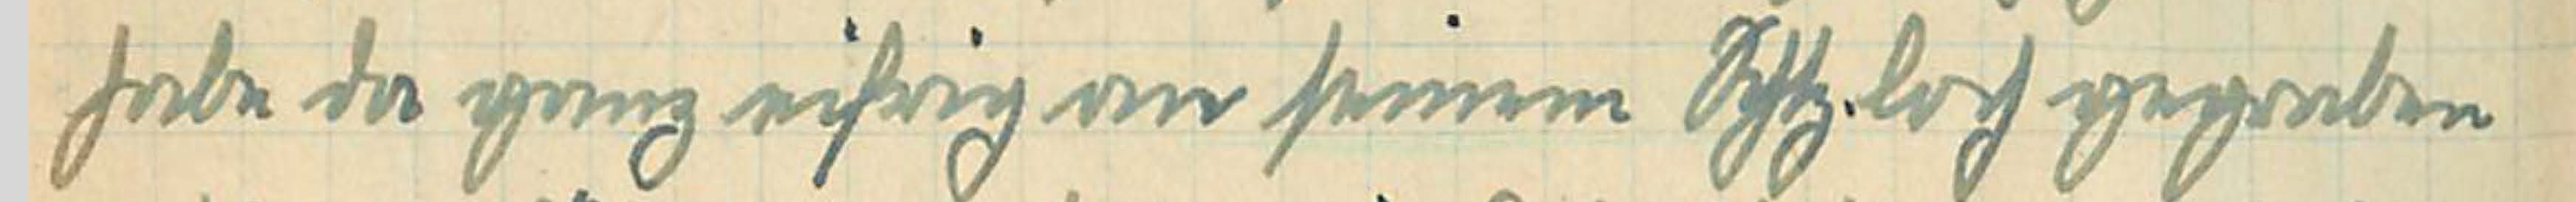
als er plötzlich vor sich eine Gestalt stehen sah. Ihm
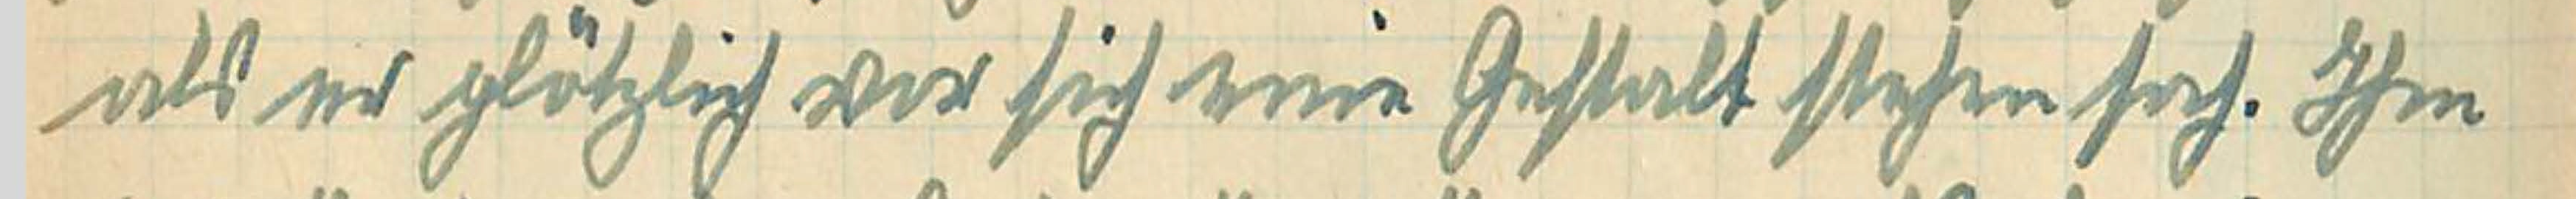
sei kein anderer Gedanke gekommen als ob ein
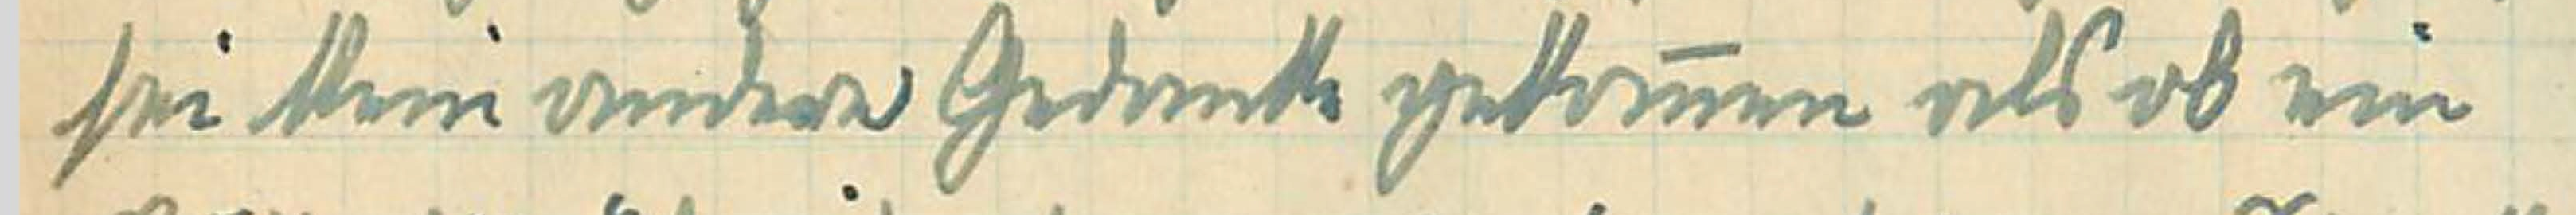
Russe sich über ihn hermachte u. er sei vor Schreck
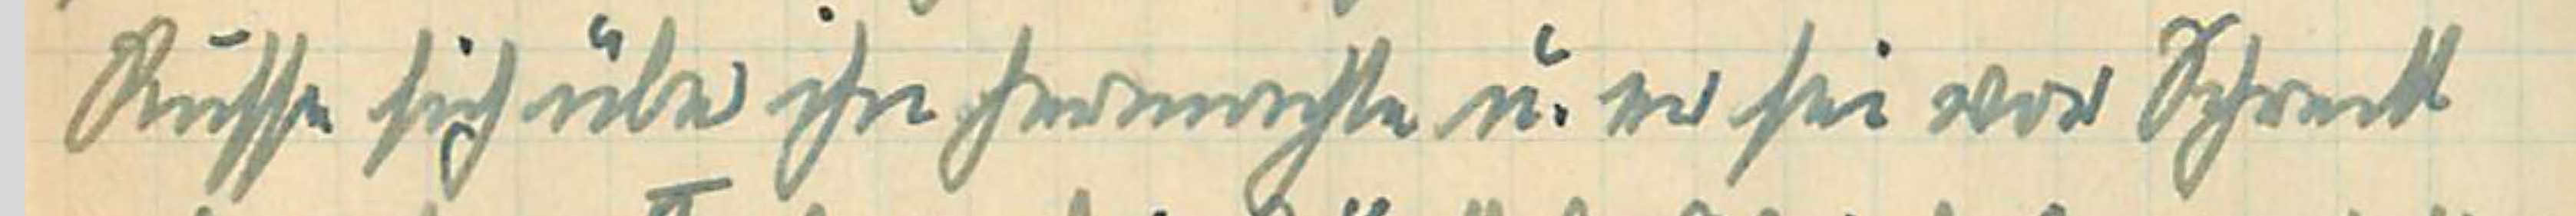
gleich dem Kerl an die Gurkel. Wie das war hatte ich
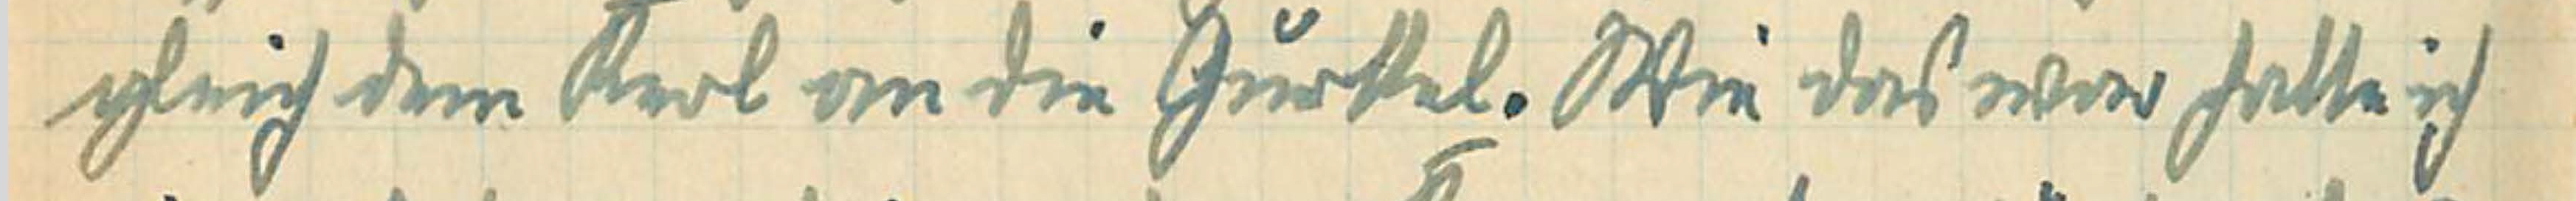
ja erfahren. Die anderen Kameraden hörten das
